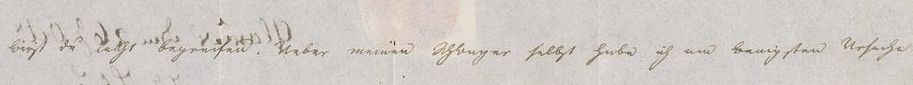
wirst Du leicht begreifen. Ueber meinen Schwager selbst habe ich am wenigsten Ursache
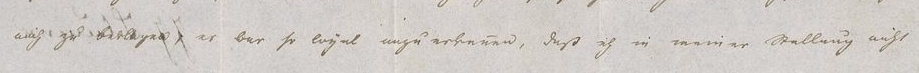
mich zu beklagen, er war so loyal anzuerkennen, daß ich in meiner Stellung nicht
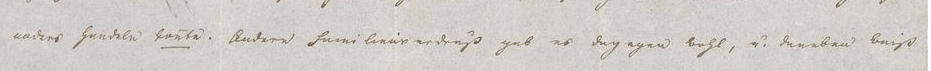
anders handeln konnte. Andern Familienverdruß gab es dagegen wohl, u. daneben weiß
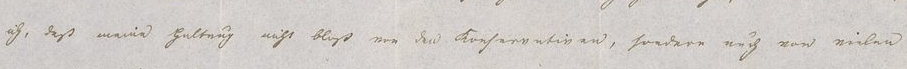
ich, daß meine Haltung nicht bloß von den Konservativen, sondern auch von vielen
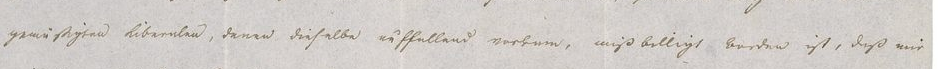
gemäßigten Liberalen, denen dieselben auffallend vorkam, mißbilligt worden ist, daß mir
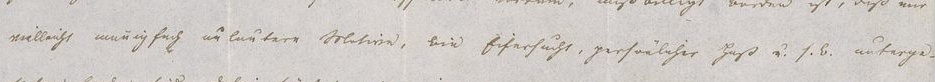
vielleicht mannigfach unlautere Motive, wie Eifersucht, persönlicher Haß u. s. w. unterge-
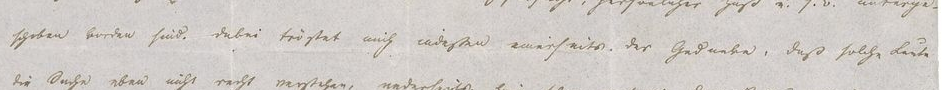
schoben worden sind. Dabei tröstet mich indessen einerseits der Gedanke, daß solche Leute
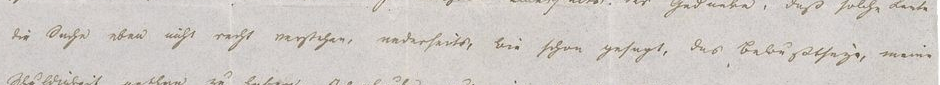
die Sache eben nicht recht verstehen, anderseits, wie schon gesagt, das Bewußtseyn, meine
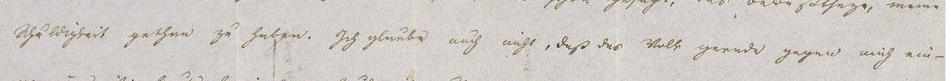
Schuldigkeit gethan zu haben. Ich glaube auch nicht, daß das Volk gerade gegen mich ein-
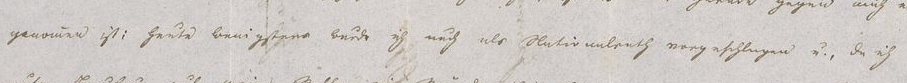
genommen ist; heute wenigstens wurde ich auch als Nationalrath vorgeschlagen u., da ich
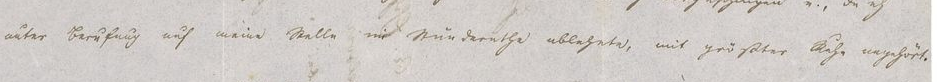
unter Berufung auf meine Stelle im Ständerathe ablehnte, mit größter Ruhe angehört.
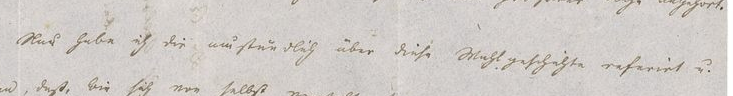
Nun habe ich Dir umständlich über diese Wahlgeschichte referirt u.
